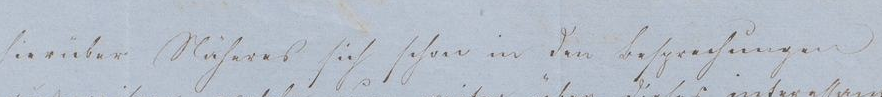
hierüber Näheres sich schon in den Besprechungen
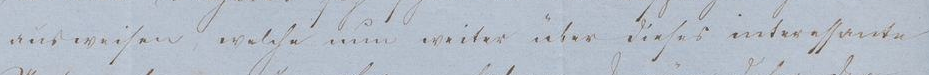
ausweisen, welche nun weiter über dieses interessante
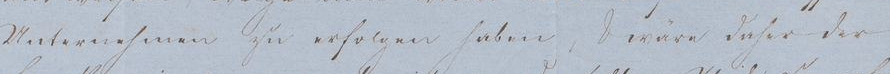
Unternehmen zu erfolgen haben, & wäre daher der
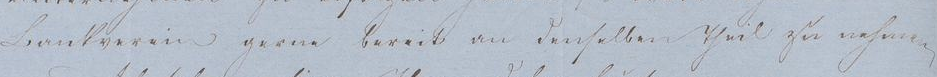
Bankverein gerne bereit an denselben Theil zu nehmen,
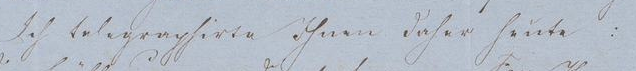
Ich telegraphirte Ihnen daher heute:
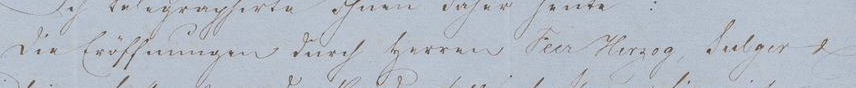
«Die Eröffnungen durch Herren Feer-Herzog, Sulger &
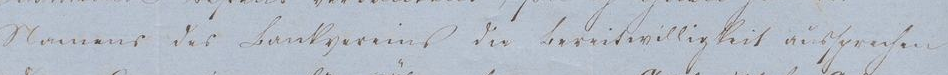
Namens des Bankvereins die Bereitwilligkeit aussprechen
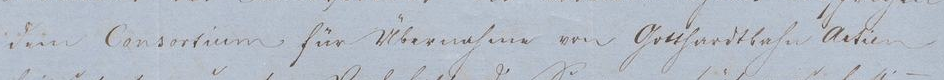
dem Consortium für Übernahme von Gotthardtbahn Actien
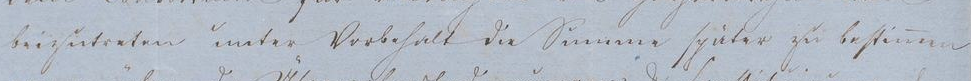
beizutreten unter Vorbehalt die Summe später zu bestimmen
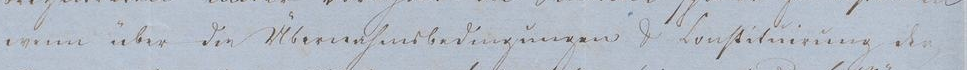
wenn über die Übernahmsbedingungen & Constituirung der
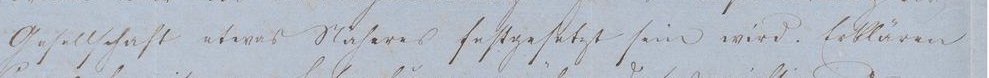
Gesellschaft etwas Näheres festgesetzt sein wird. Erklären
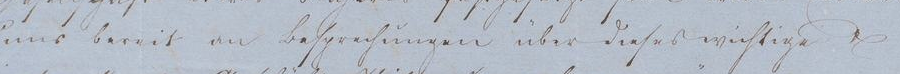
uns bereit an Besprechungen über dieses wichtige &
